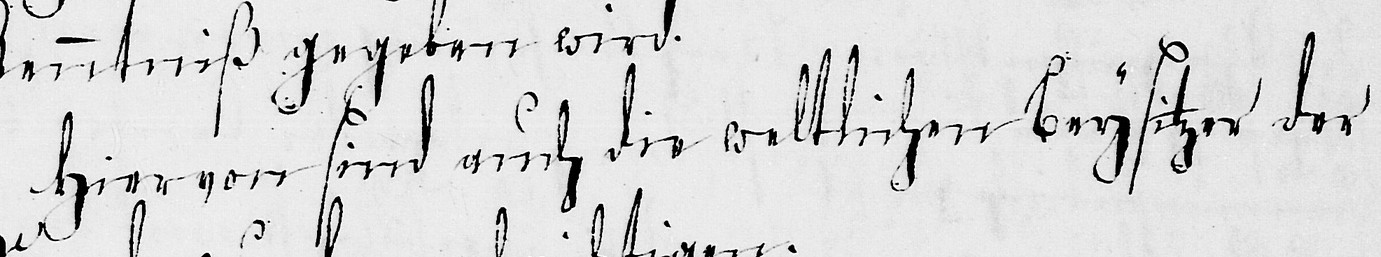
Hiervon sind auch die weltlichen Beysitzer der
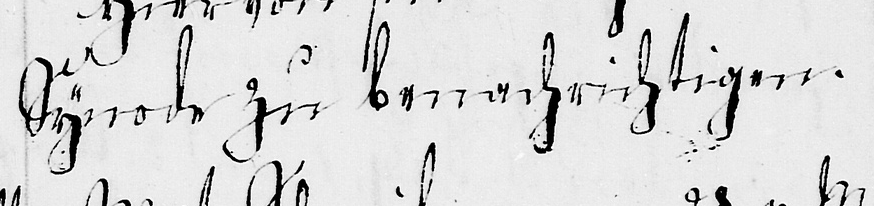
Synode zu benachrichtigen.
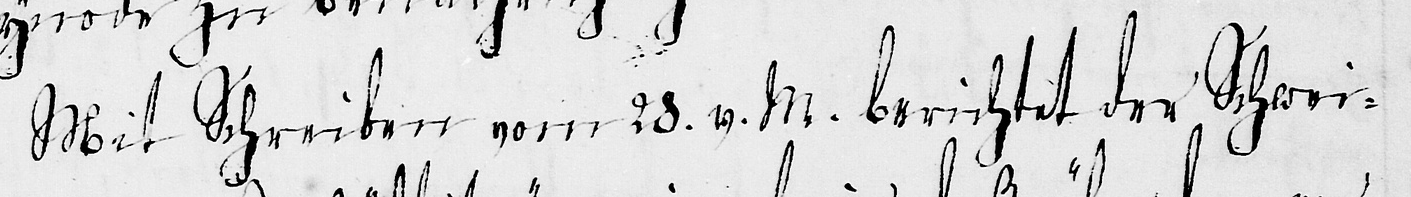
Mit Schreiben vom 28. v. M. berichtet der Schwei¬
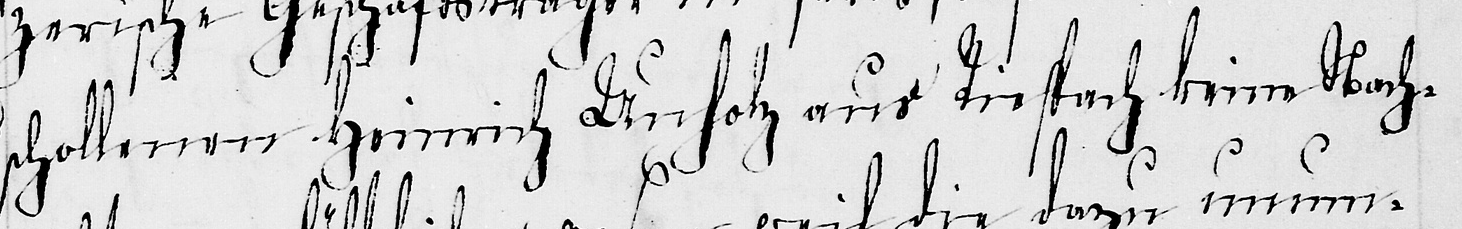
hollenen Heinrich Unholz aus Riespach keine Nach¬
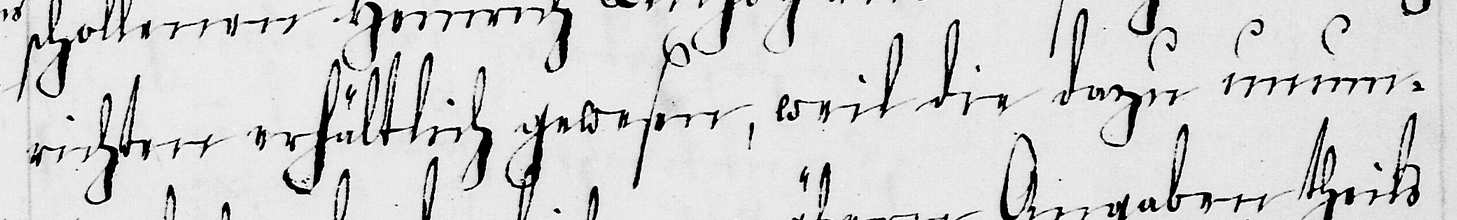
richten erhältlich gewesen, weil die dazu unum¬
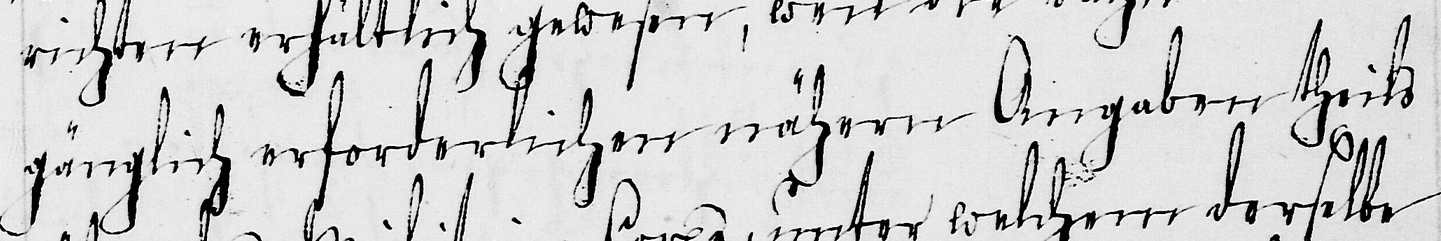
gänglich erforderlichen nähern Angaben theils
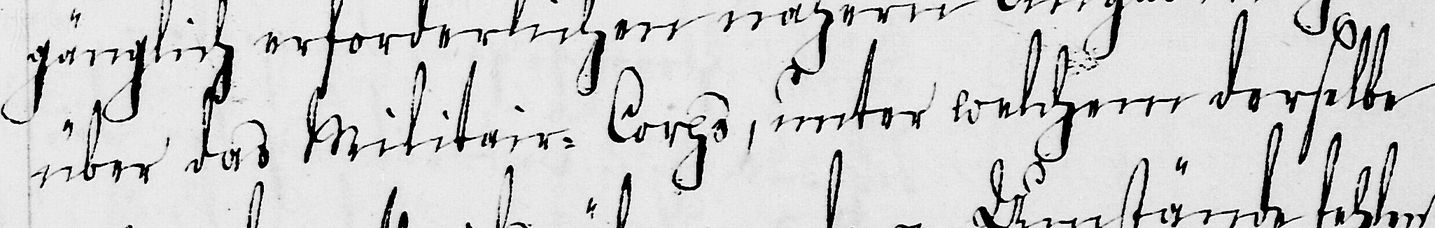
über das Militair-Corps, unter welchem derselbe
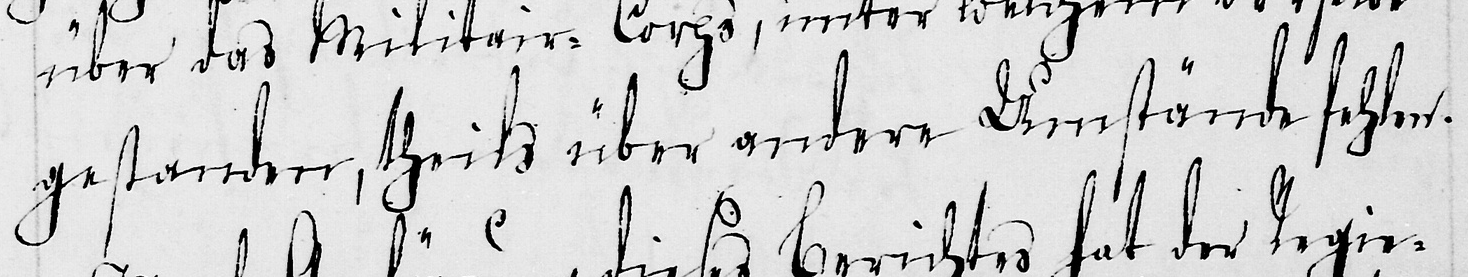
gestanden, theils über andere Umstände fehlen.
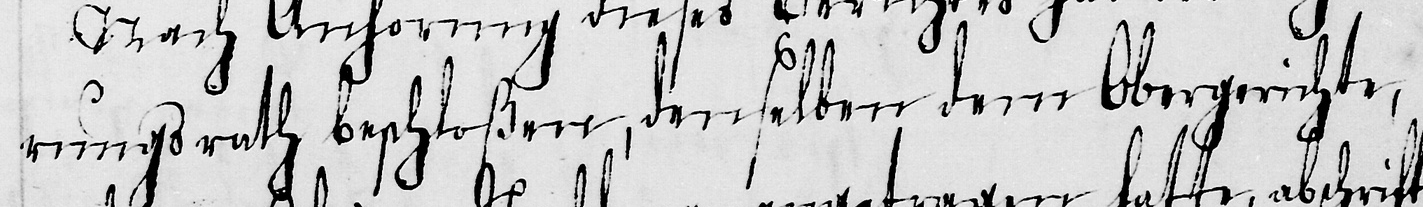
rungsrath beschloßen, denselben dem Obergerichte,
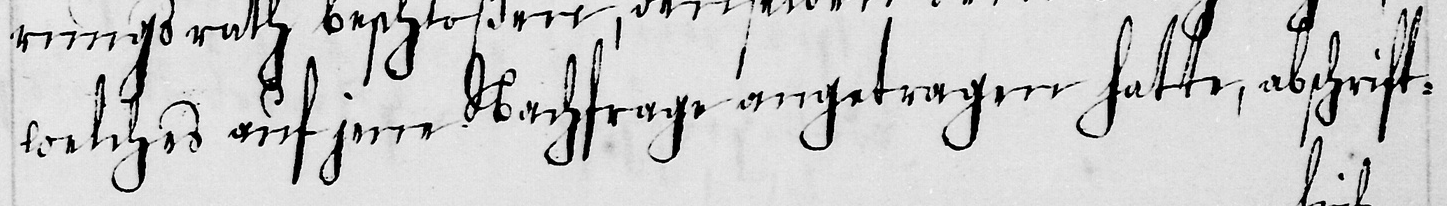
welches auf jene Nachfrage angetragen hatte, abschrift-
